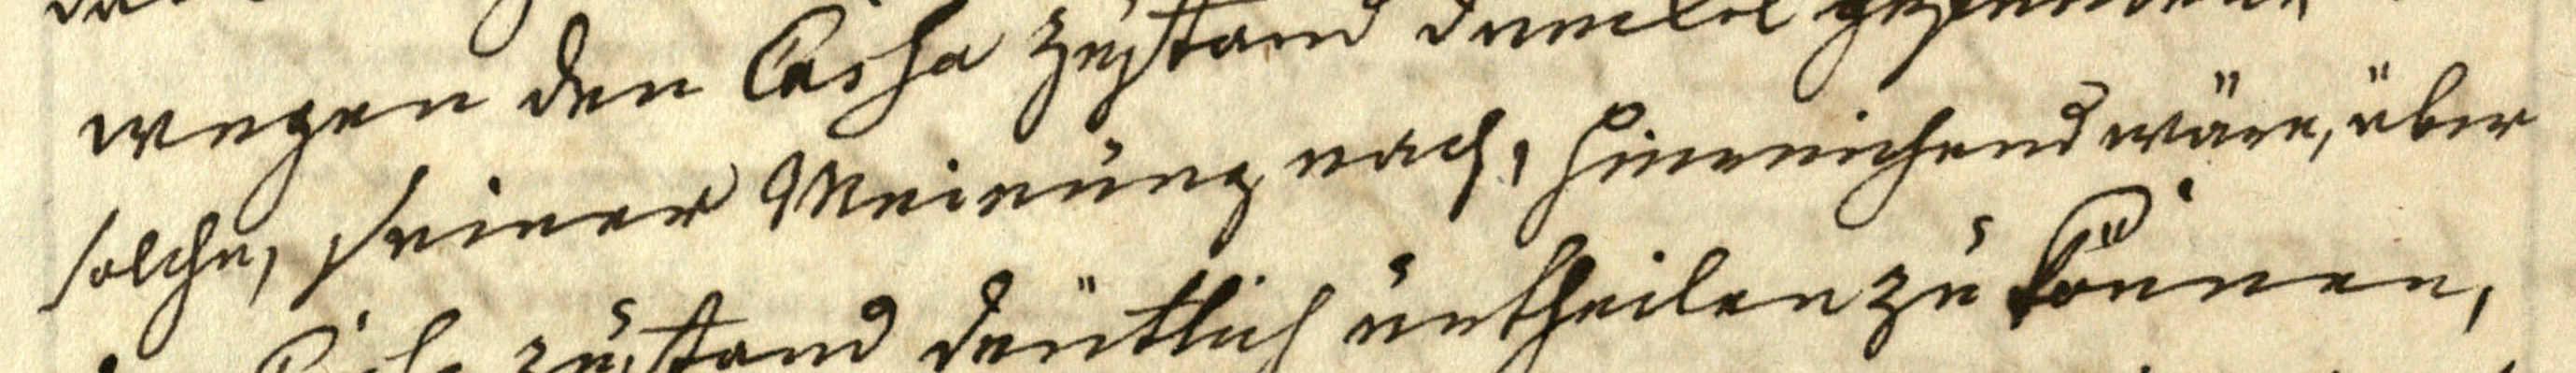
solche, seiner Meinung nach, hinreichend wäre, über
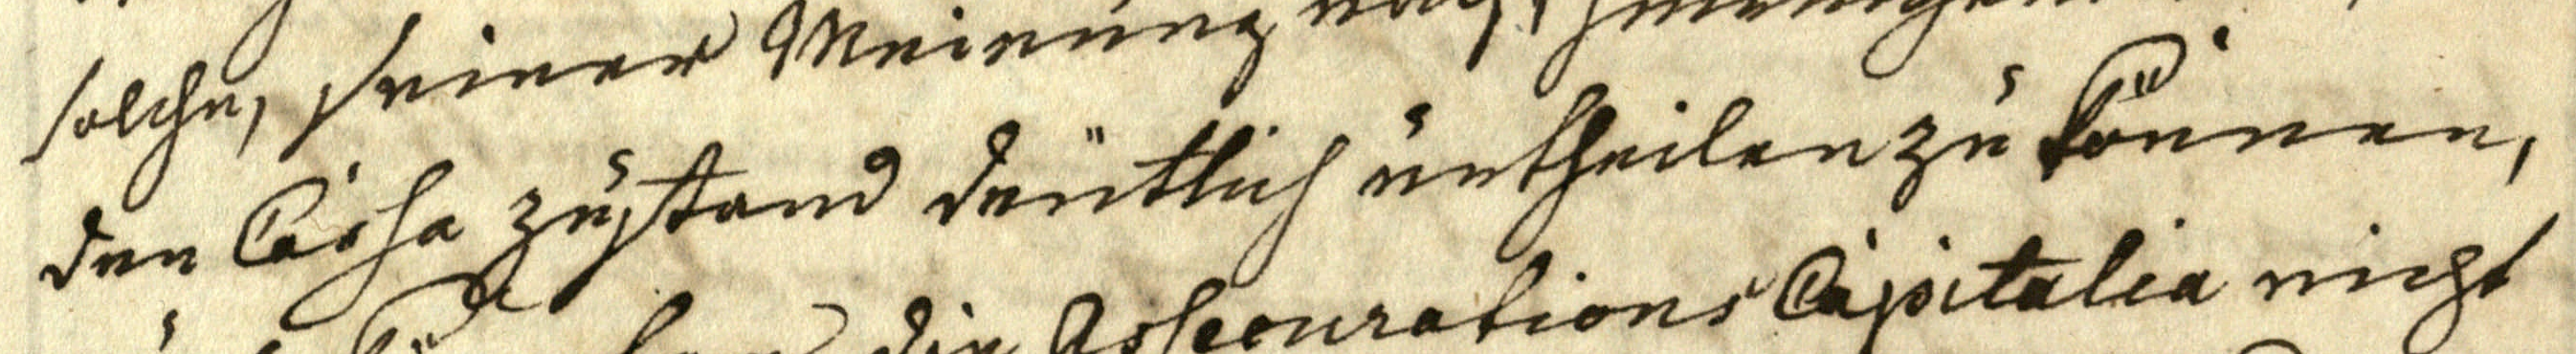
den Cassa zustand deutlich urtheilen zu können,
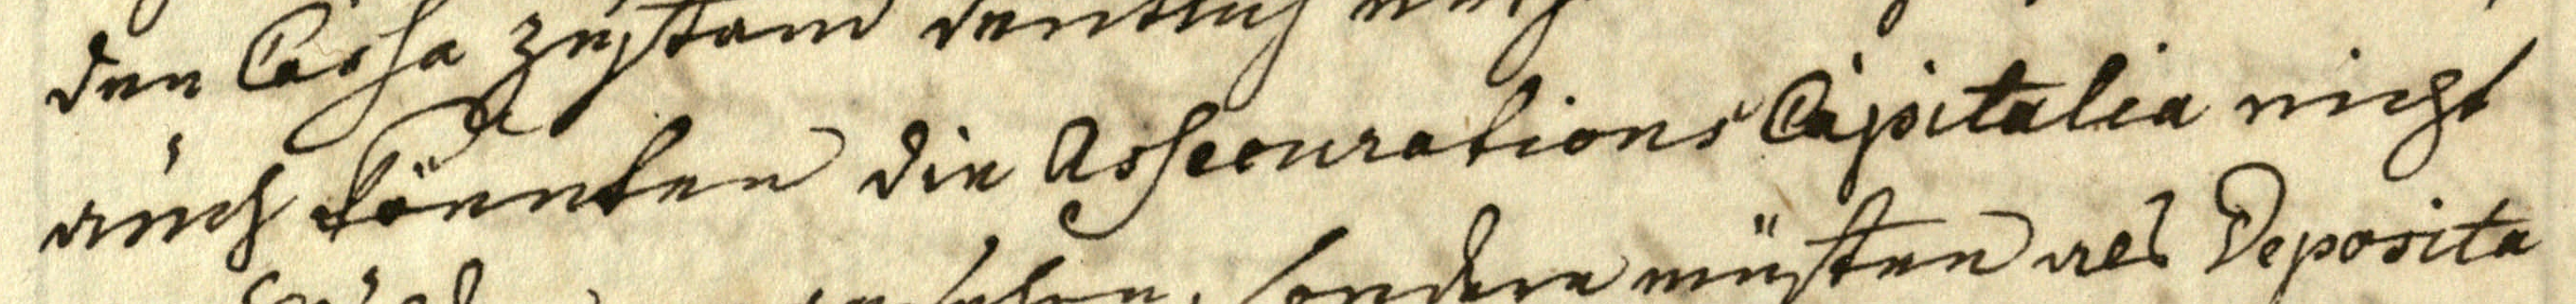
auch könnten die Assecurations Capitalia nicht
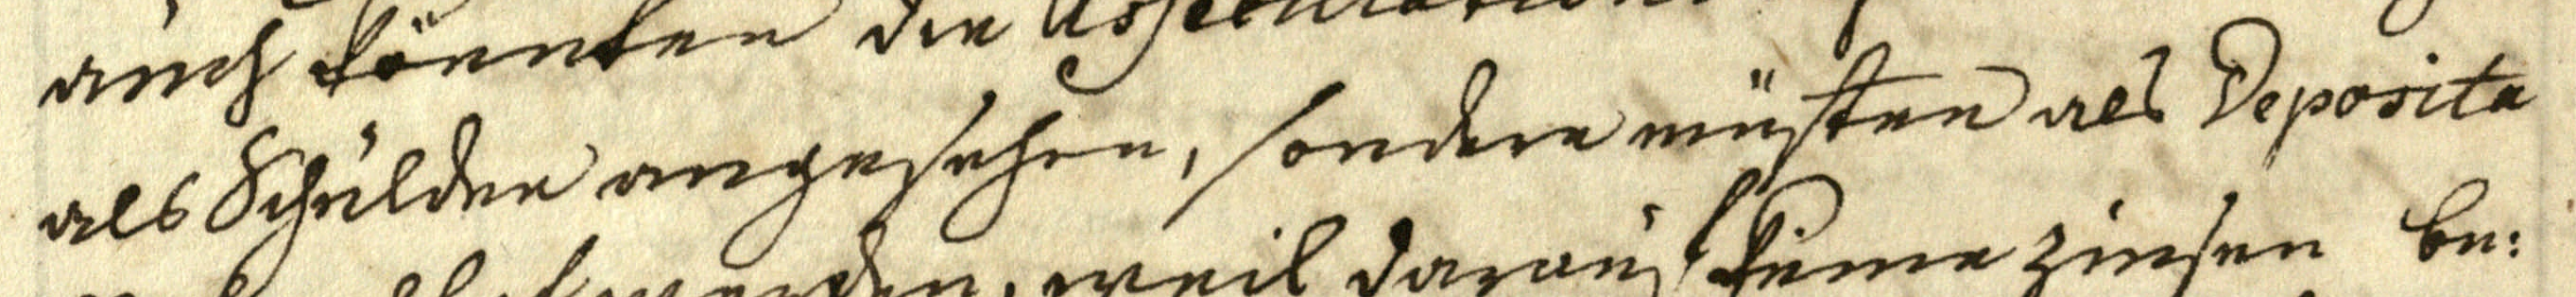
als Schulden angesehen, sondern müsten als Deposita
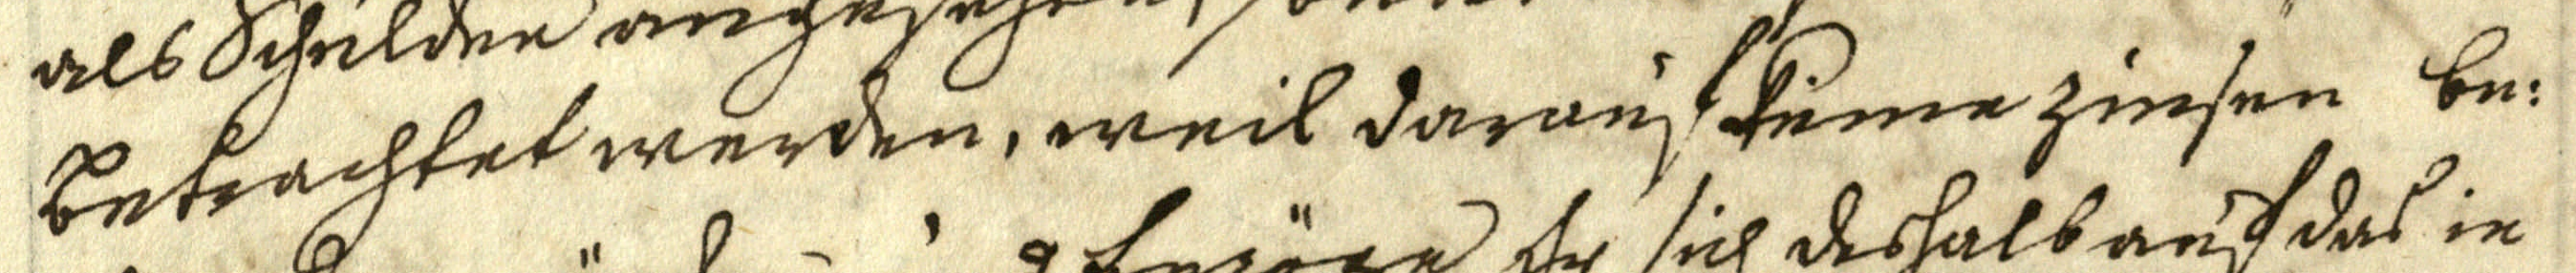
betrachtet werden, weil darauf keine Zinsen be¬
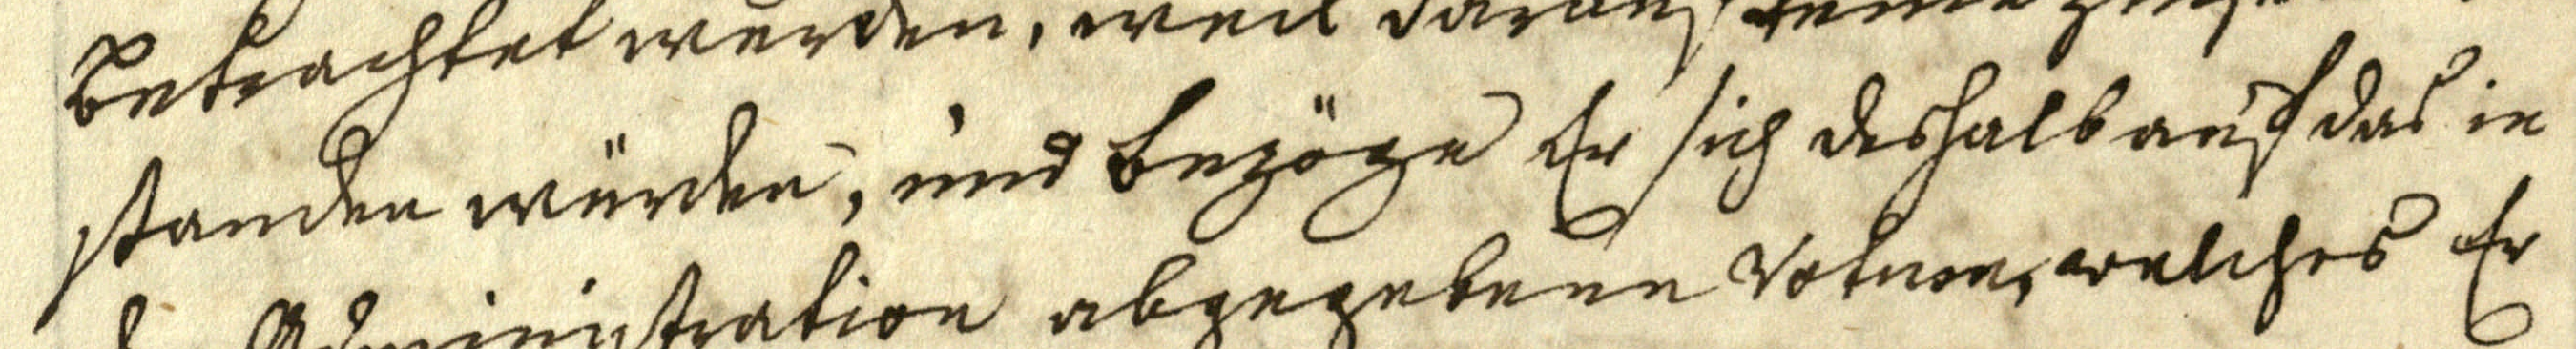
standen würden, und bezöge Er sich deshalb auf das in
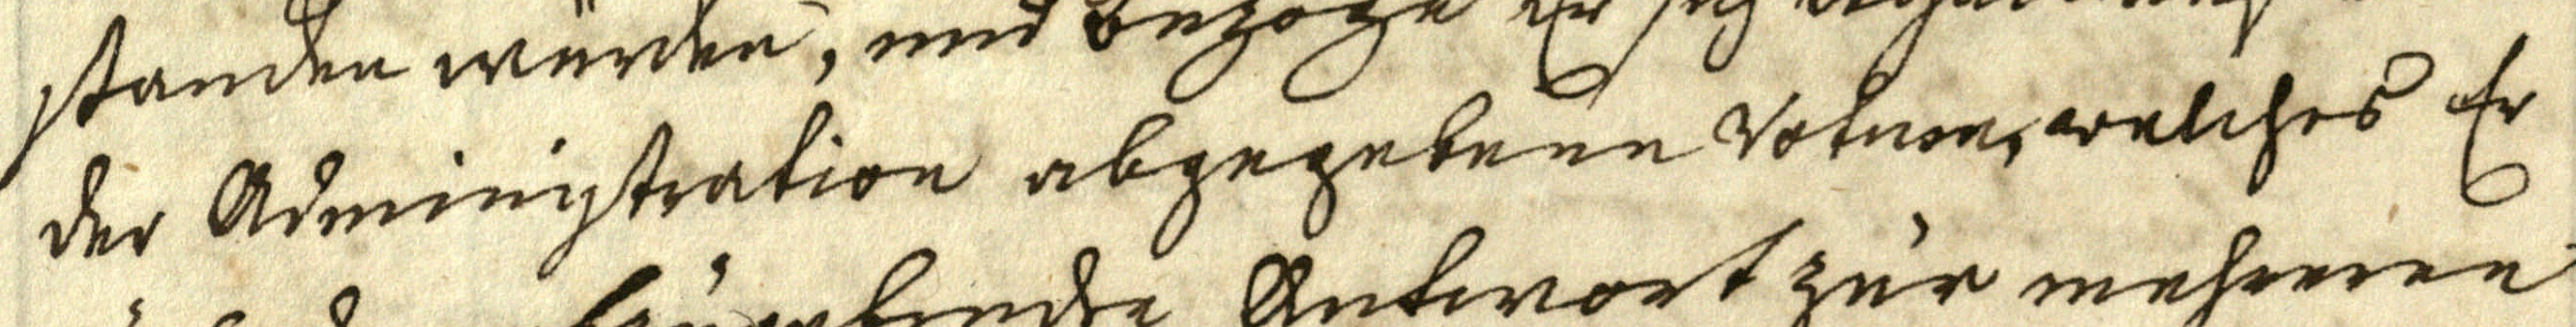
der Administration abgegebene Votum, welches Er
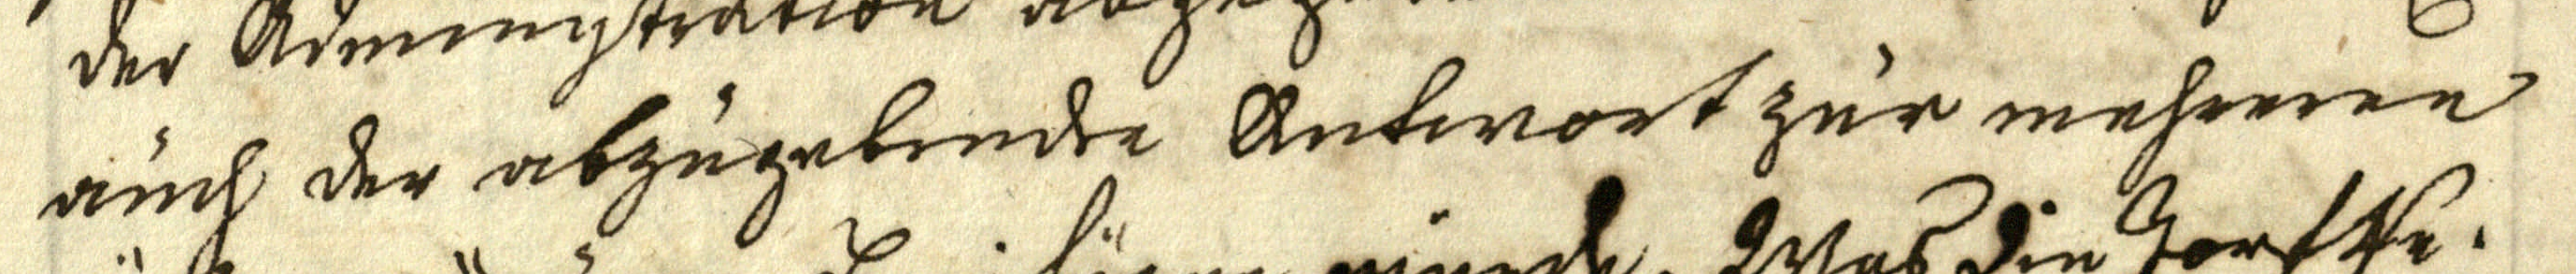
auch der abzugebenden Antwort zur mehreren
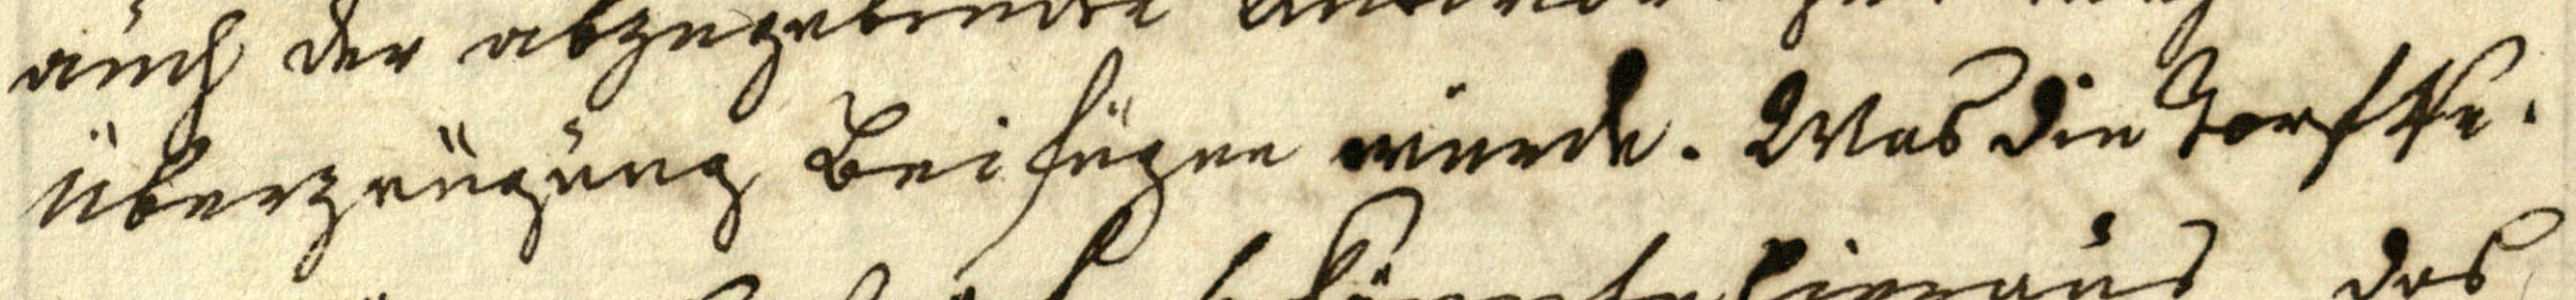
Überzeugung beifügen würde. Was die TorfRe¬
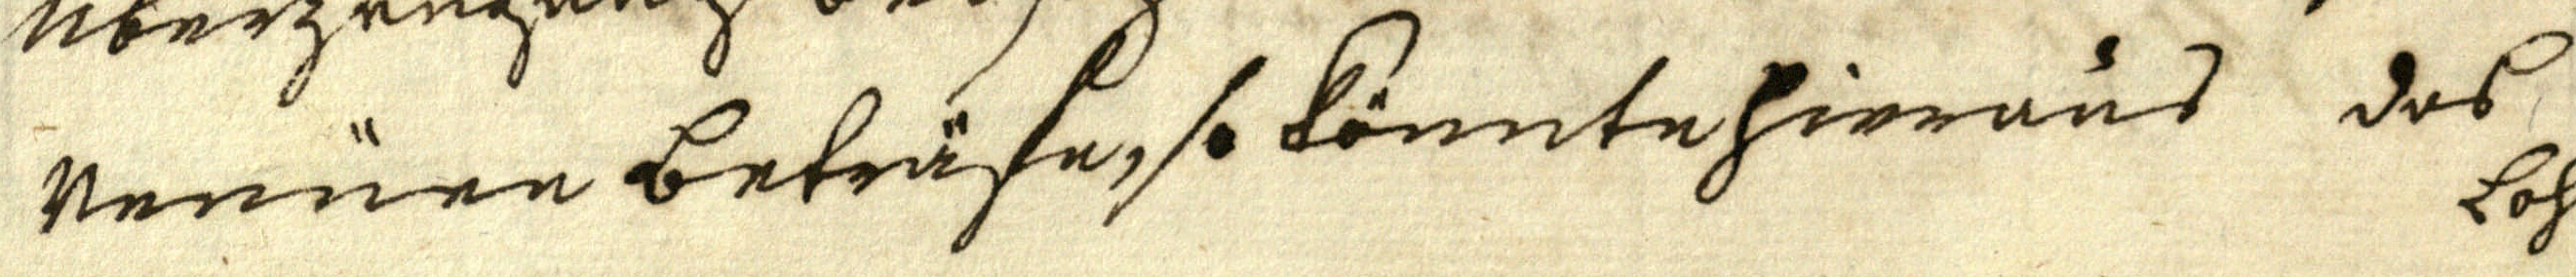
venuen beträfe, so könnte hieraus das
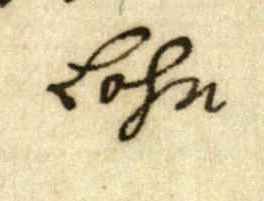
Lohn
